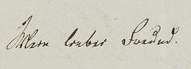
Mein lieber Freund.
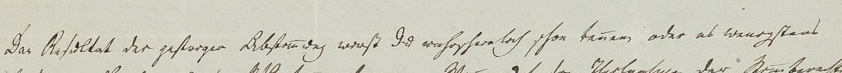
Das Resultat der gestrigen Abstimmung wirst Du wahrscheinlich schon kennen, oder es wenigstens
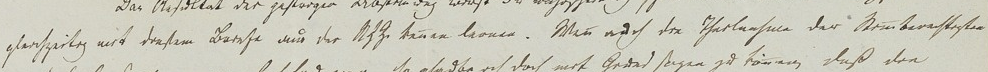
gleichzeitig mit diesem Briefe aus der NZZ. kennen lernen. Wenn auch die Theilnahme der Stimmberechtigten
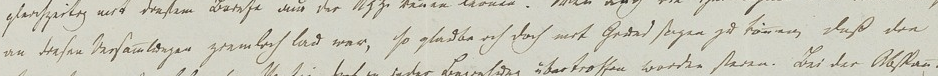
an diesen Versammlungen ziemlich lau war, so glaube ich doch mit Grund sagen zu können, daß die
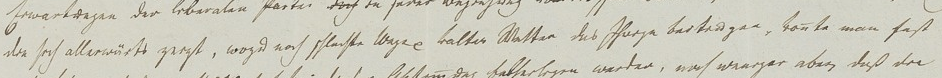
die sich allerwärts zeigt, wozu noch schlechte Wege & kaltes Wetter das Ihrige beitrugen, konnte man fast
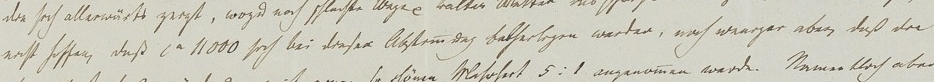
nicht hoffen, daß ca 11000 sich bei dieser Abstimmung betheiligen werden, noch weniger aber, daß die
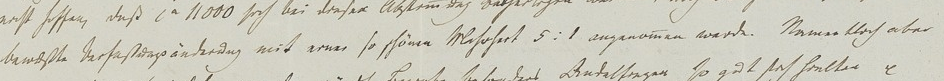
bewußte Verfassungsänderung mit einer so schönen Mehrheit 5:1 angenommen werde. Namentlich aber
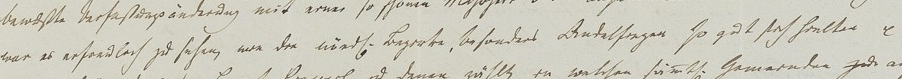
war es erfreulich zu sehen, wie die nördlichen Bezirke, besonders Andelfingen so gut sich hielten &
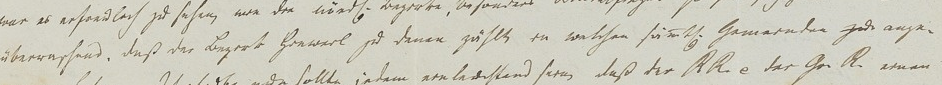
überraschend, daß der Bezirk Hinweil zu denen zählt, in welchen sämmtliche Gemeinden ange-
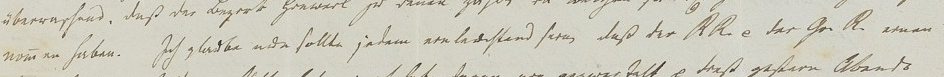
nommen haben. Ich glaube nun sollte jedem einleuchtend sein, daß der RR. & der Gr. R. einen
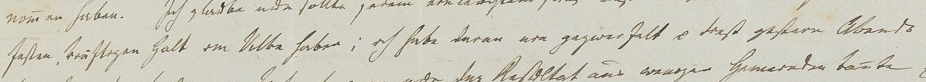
festen, kräftigen Halt im Volke haben; ich habe daran nie gezweifelt & dieß gestern Abends
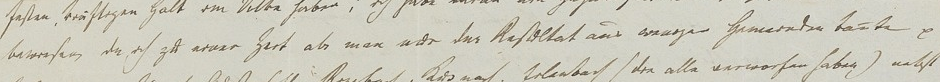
bewiesen, da ich zu einer Zeit als man nur das Resultat aus wenigen Gemeinden kannte u
